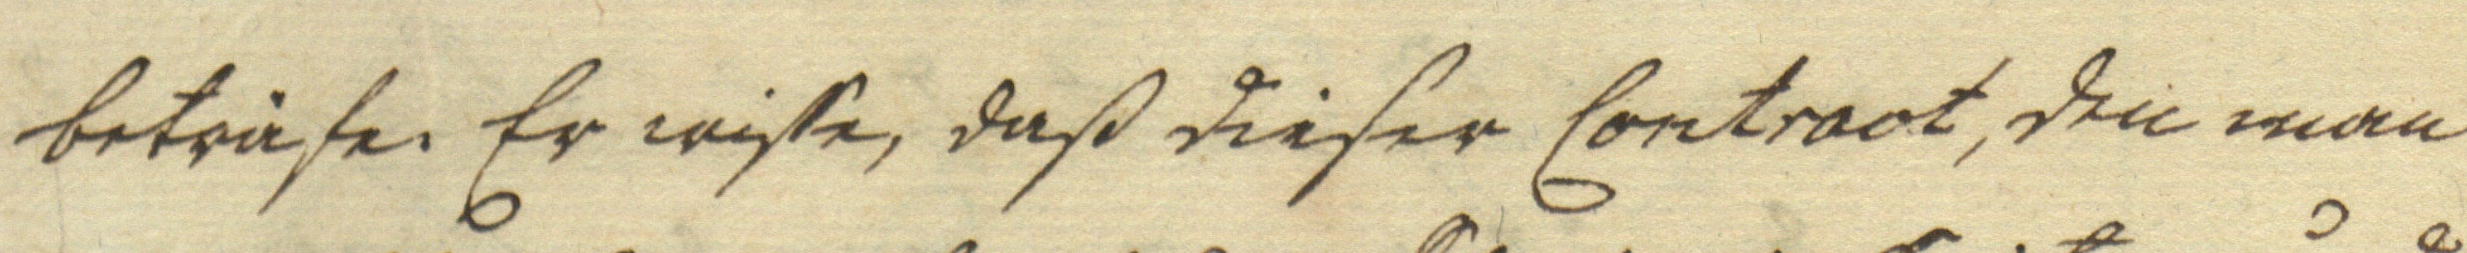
beträfe. Er wisse, daß dieser Contract, den man
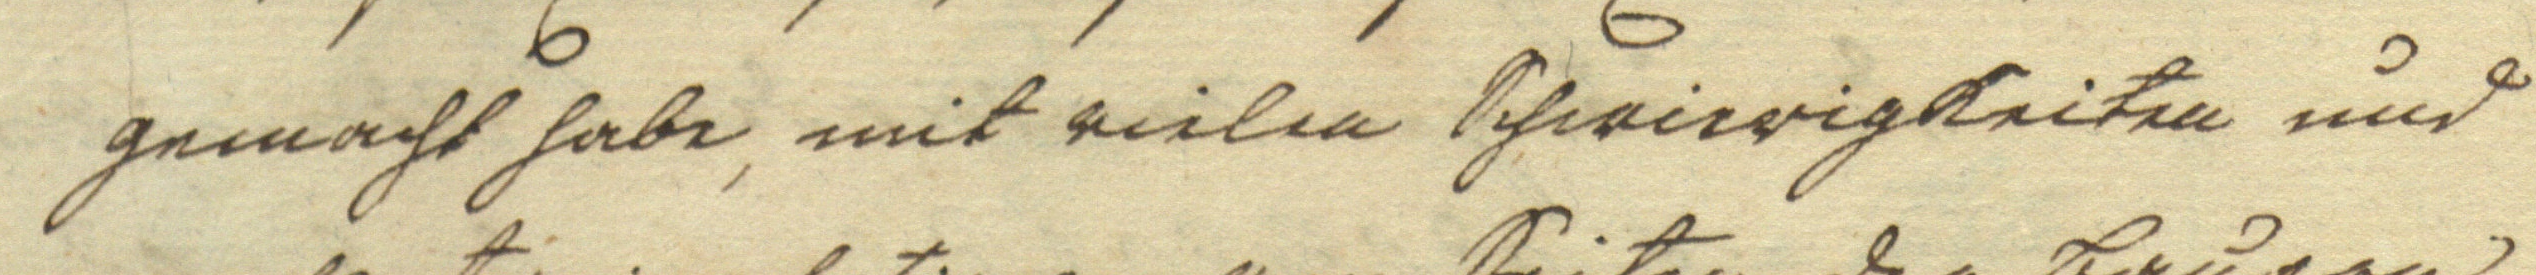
gemacht habe, mit vielen Schwierigkeiten und
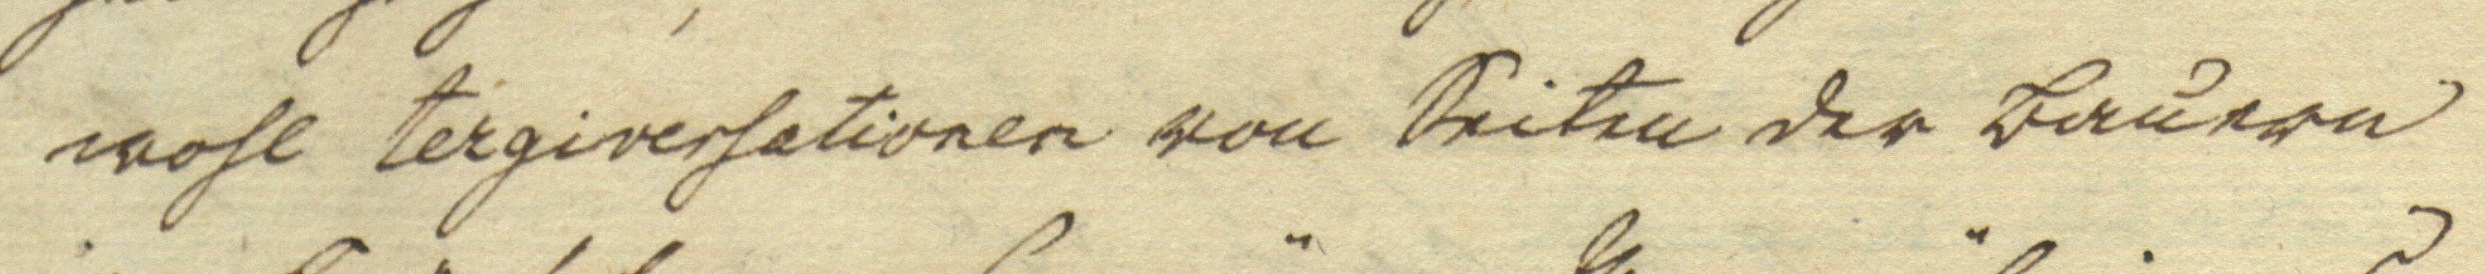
wohl tergiversationen von Seiten der Bauern
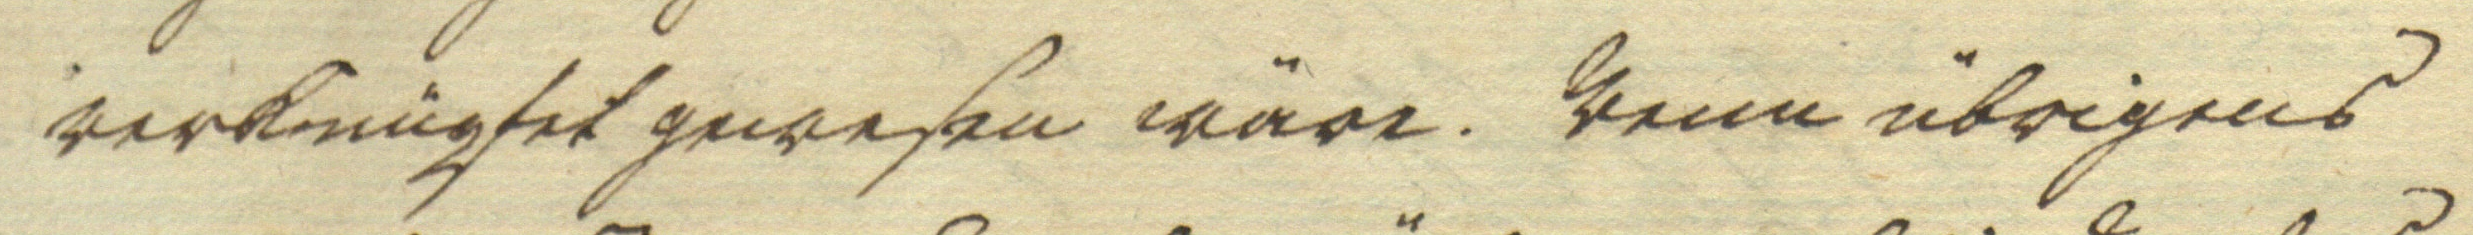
verknüpfet gewesen wäre. Wenn übrigens
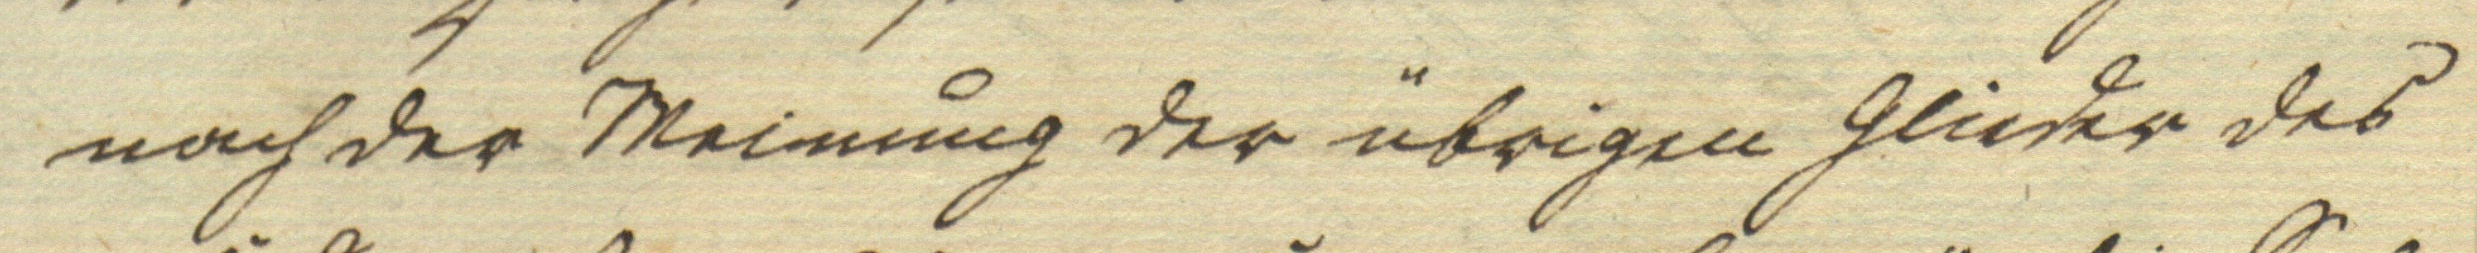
nach der Meinung der übrigen Glieder des
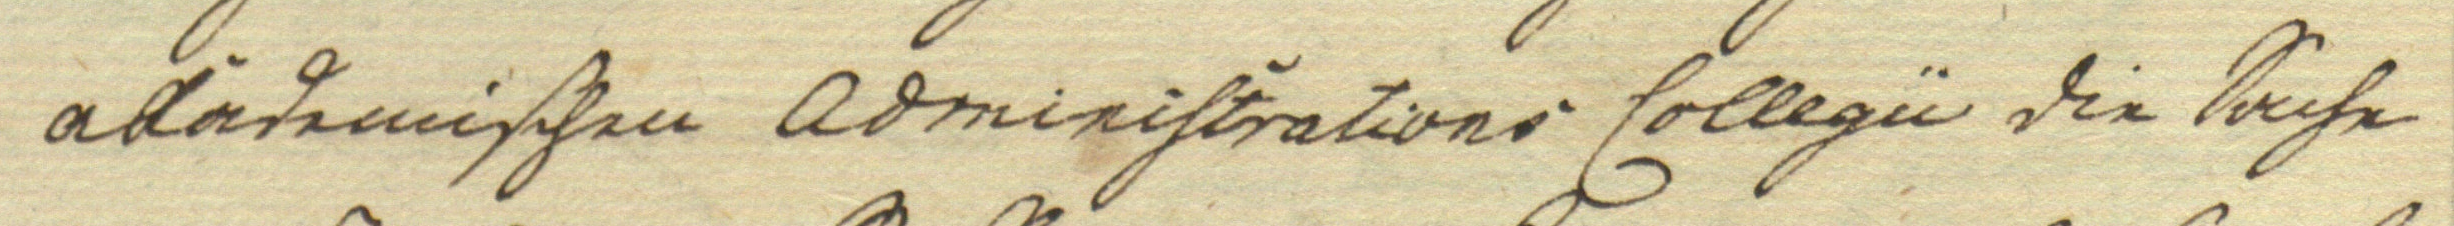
akademischen Administrations Collegii die Sache
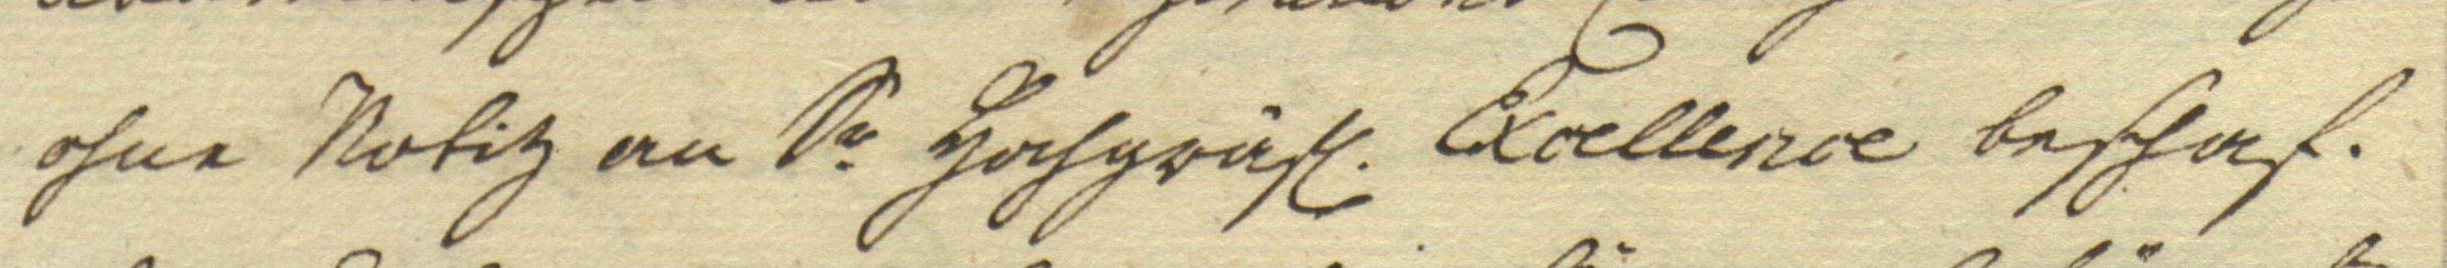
ohne Notiz an Sr Hochgräfl. Excellence beschaf¬
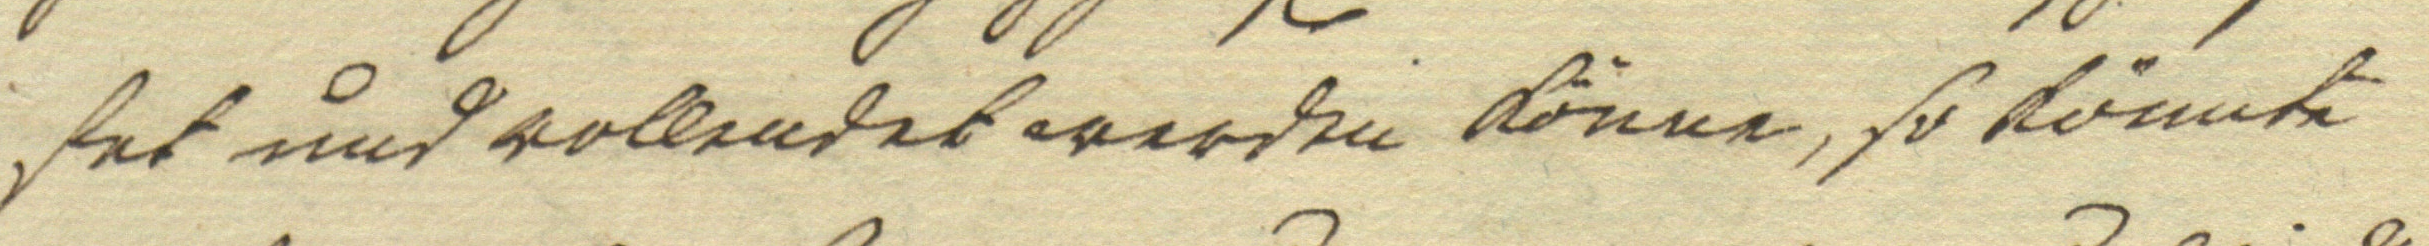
et und vollendet werden könne, so könnte
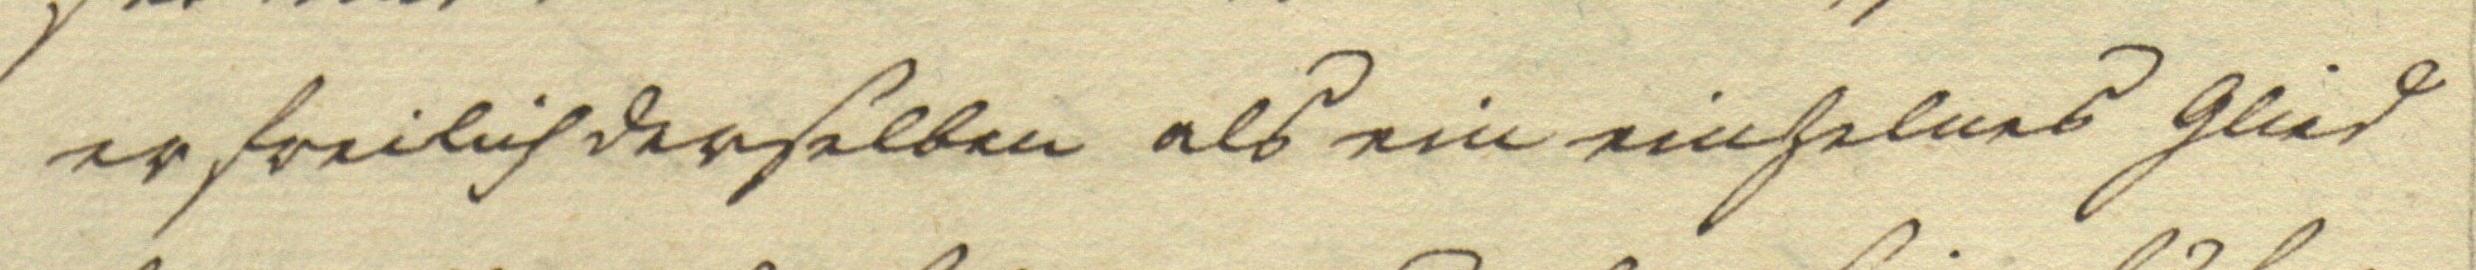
er freilich derselben als ein einzelnes Glied
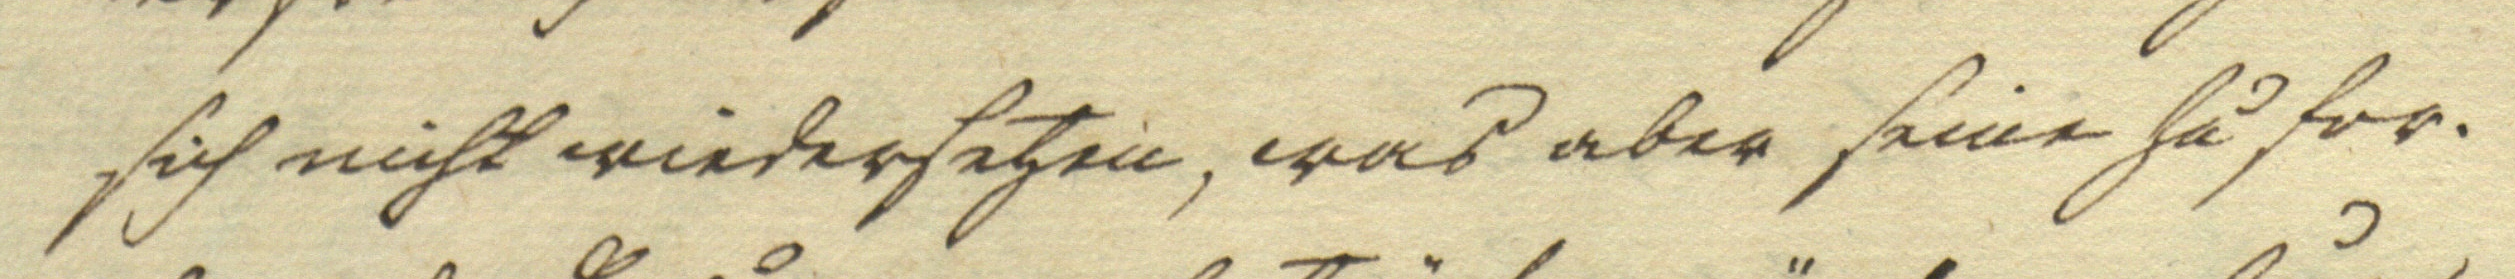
sich nicht wiedersetzen, was aber seine zu for¬
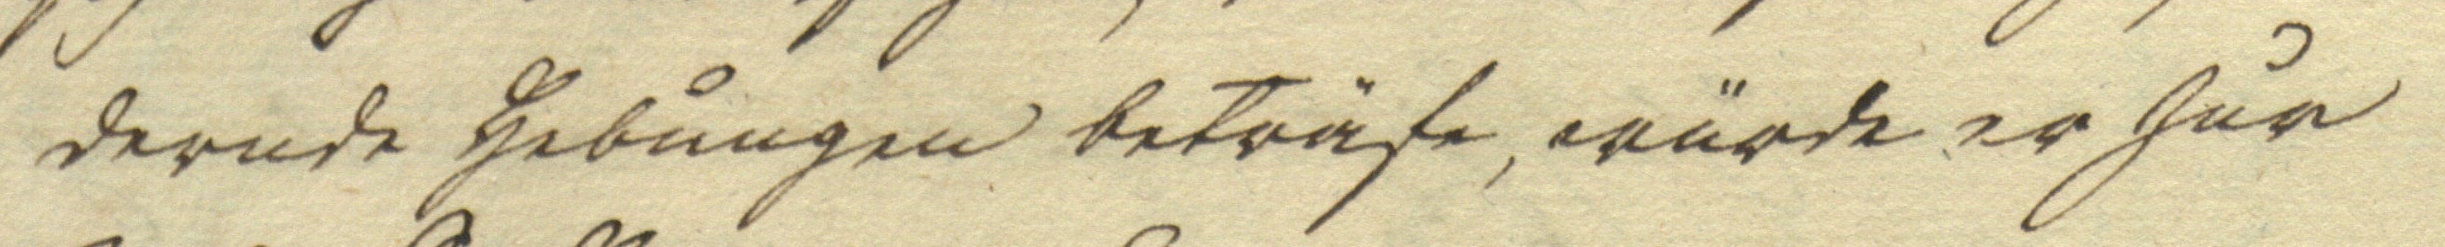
dernde Hebungen beträfe, würde er zur
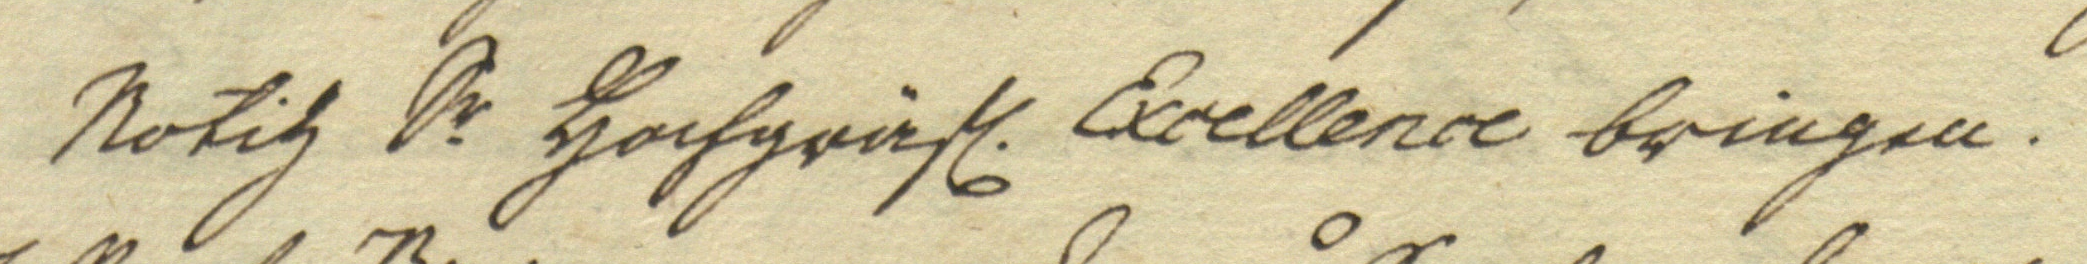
Notiz Sr Hochgräfl. Excellence bringen.
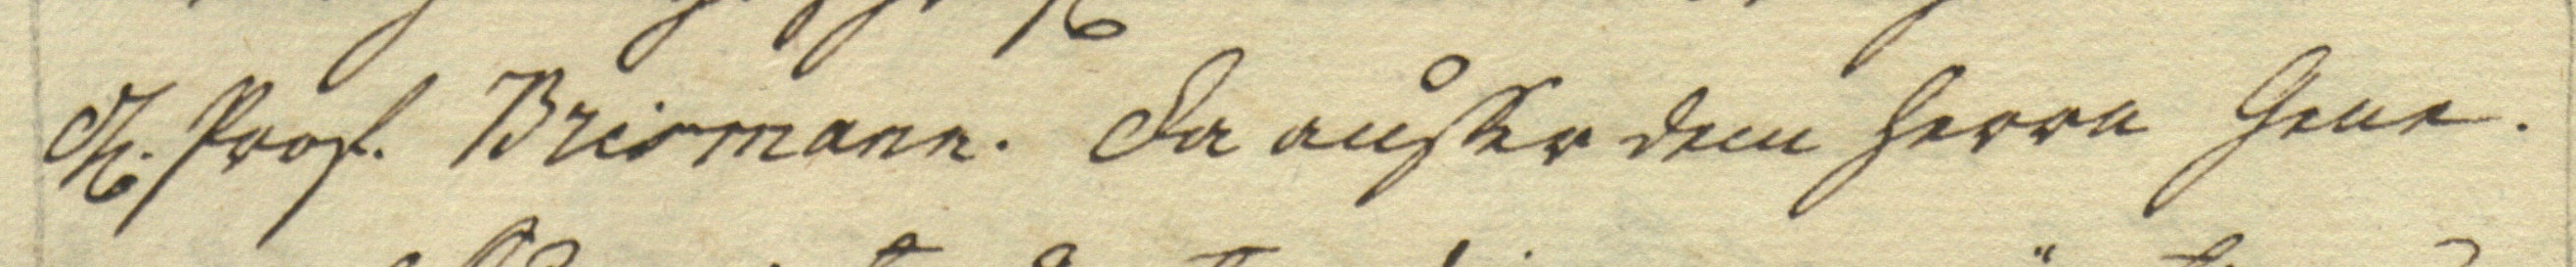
dh. Prof. Brismann. Da ausser dem Herrn Gene¬
